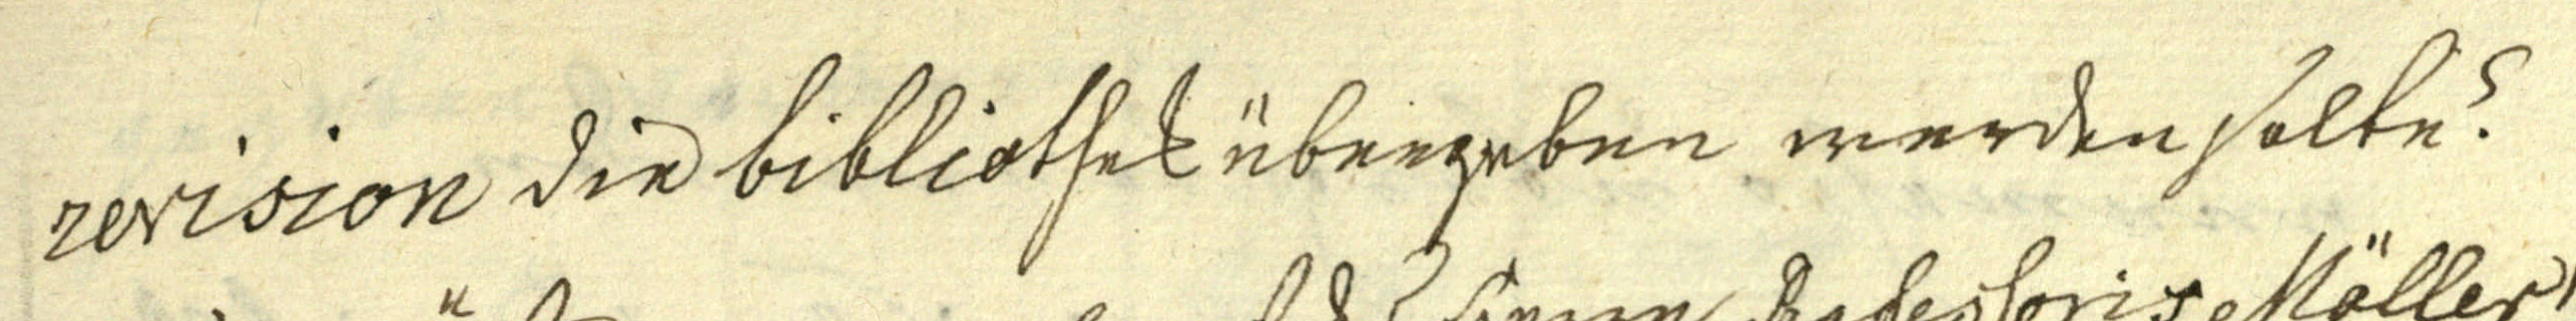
revision die Bibliothek übergeben werden solte?
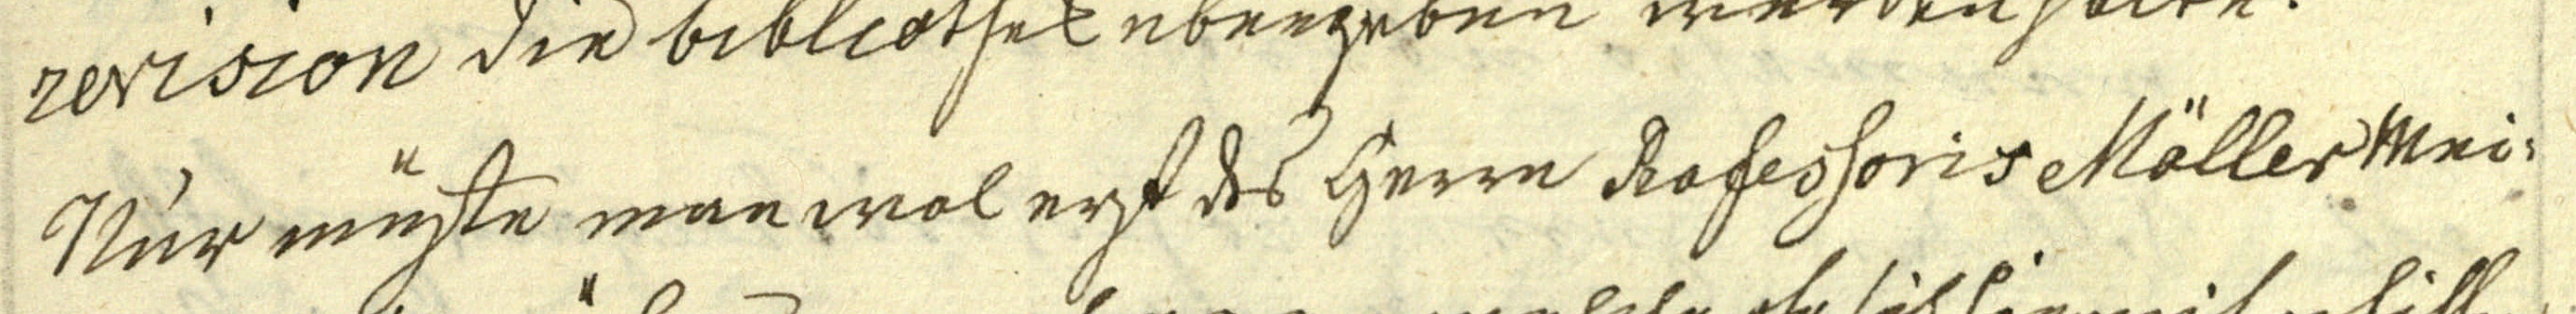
Nur müste man wol erst des Herrn Professoris Möller Mei¬
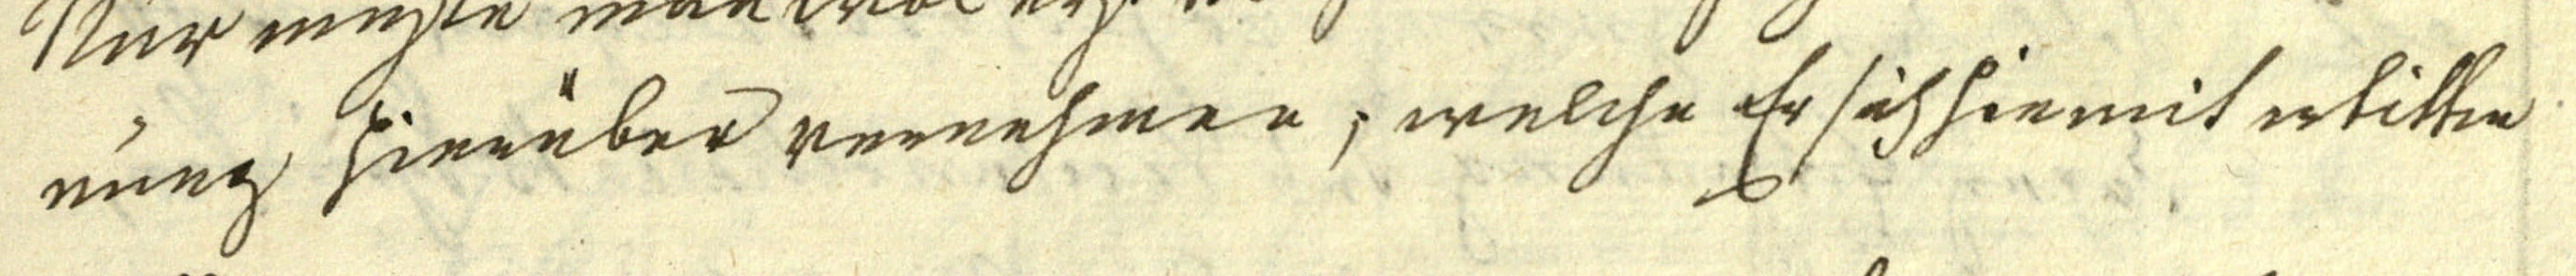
nung hierüber vernehmen, welche Er sich hiemit erbitten
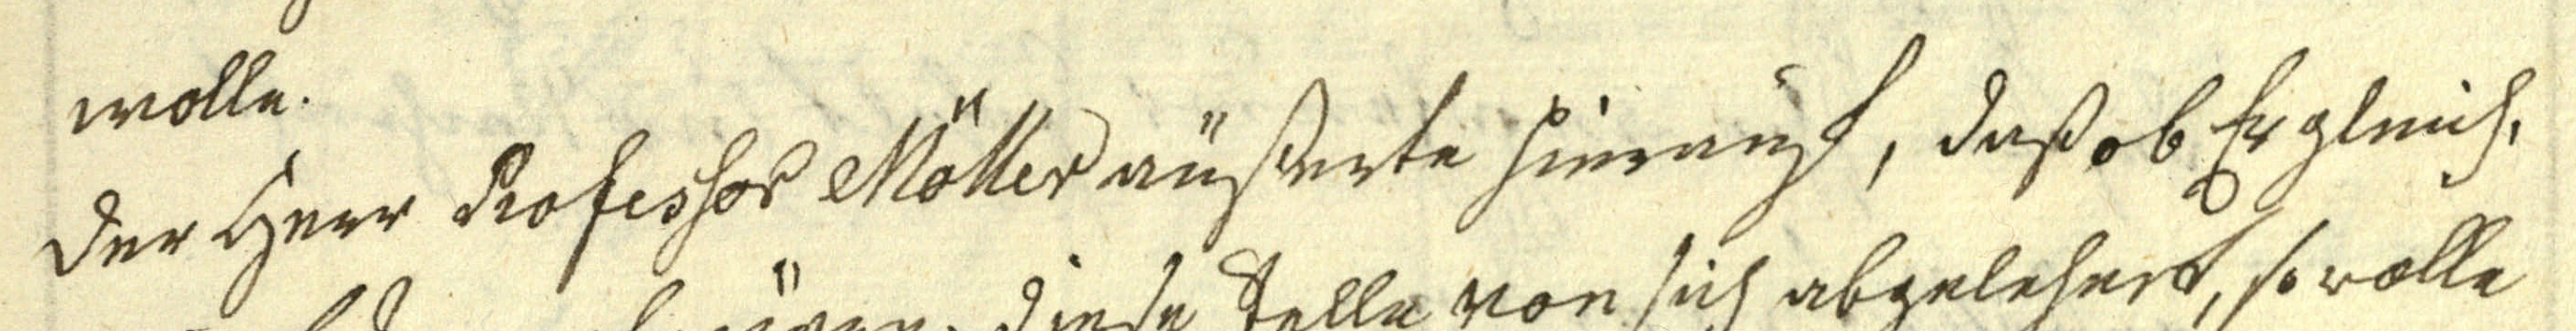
Der Herr Professor Möller äußerte hierauf, daß ob Er gleich¬
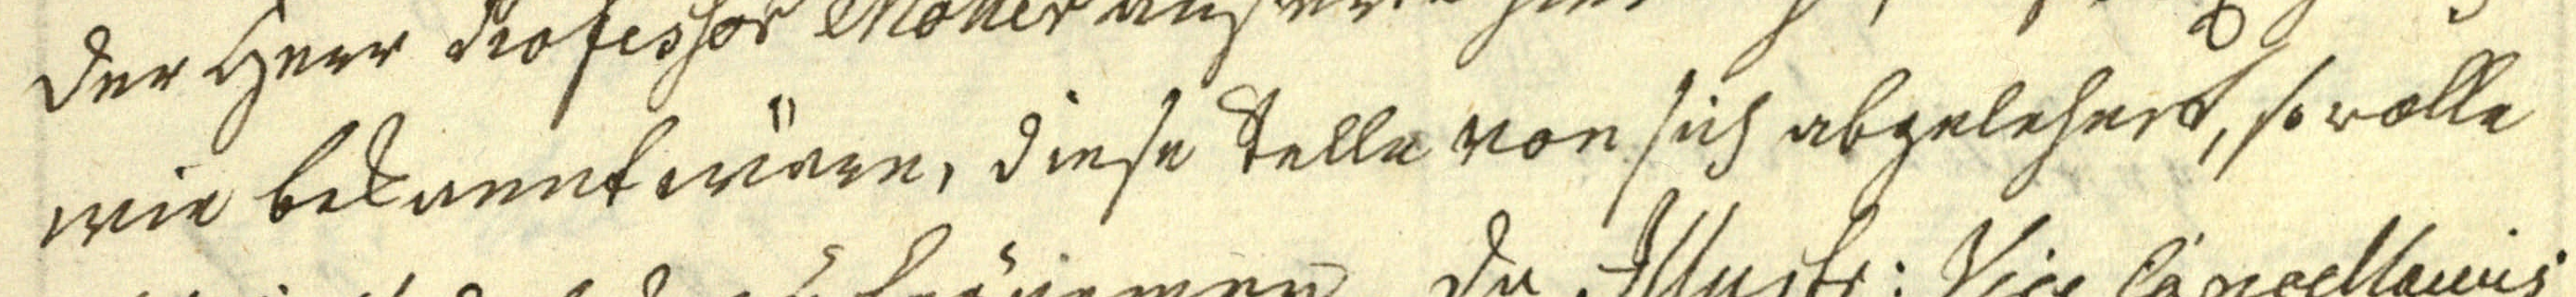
wie bekannt wäre, diese Stelle von sich abgelehnet, so wolle
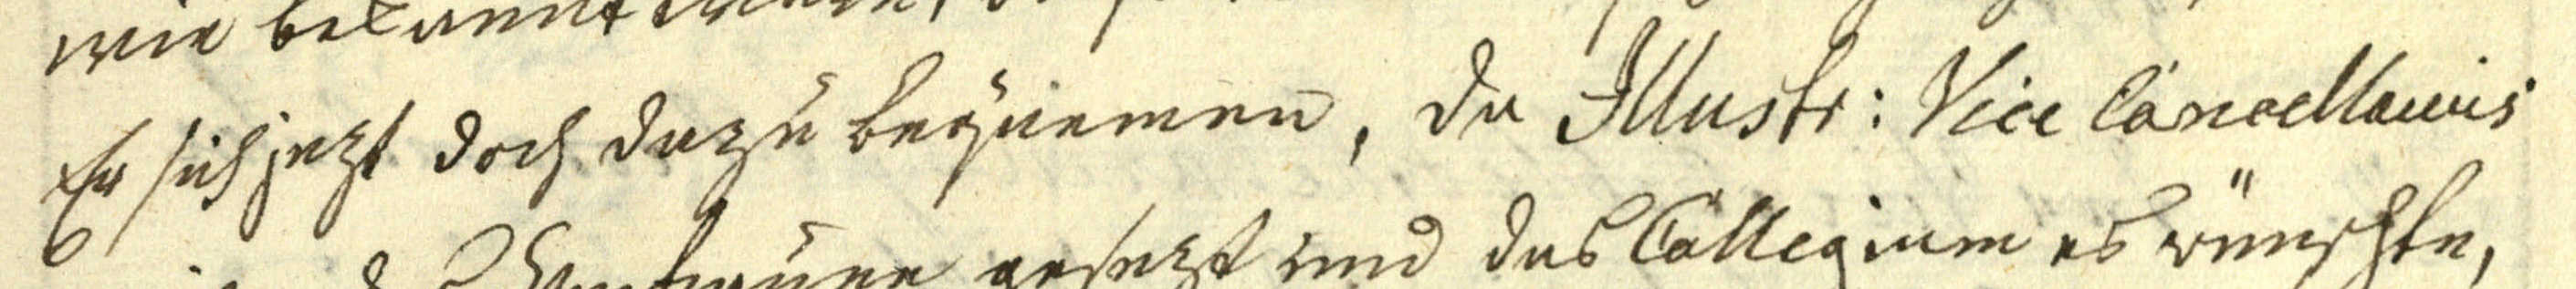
Er sich jezt doch dazu bequemen, da Illustr. Vice Cancellarius
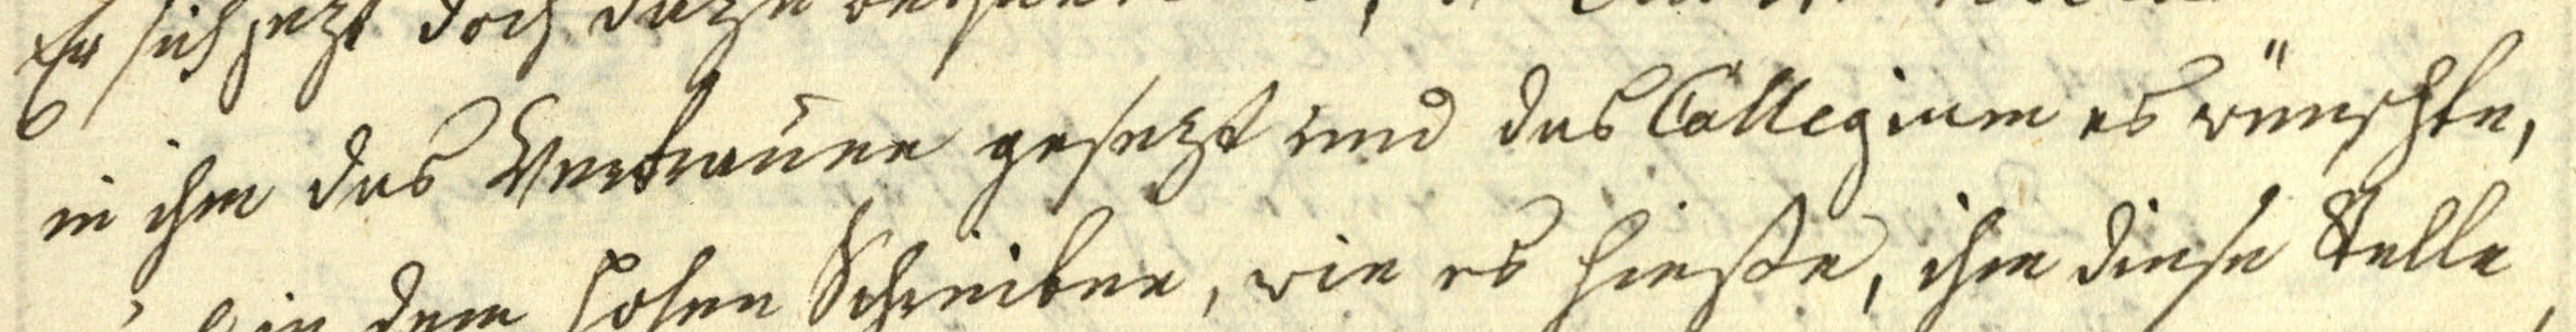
in ihm das Vertrauen gesezt und das Collegium es wünschte,
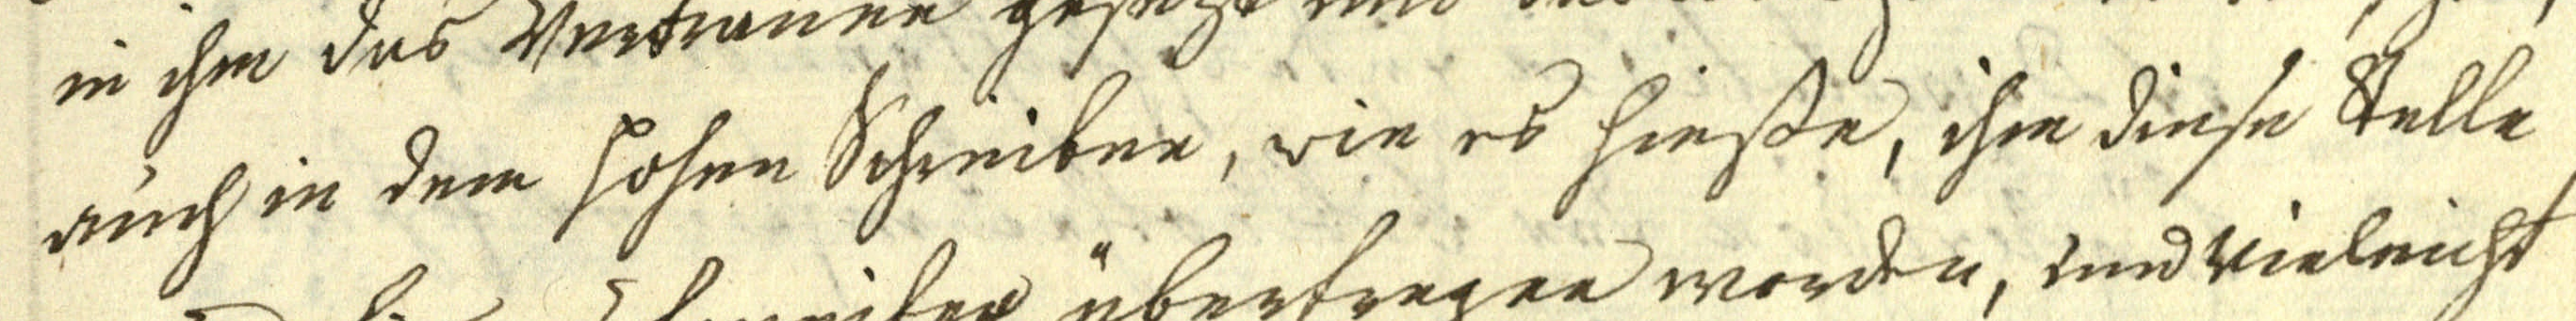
auch in dem hohen Schreiben, wie es hieße, ihm diese Stelle
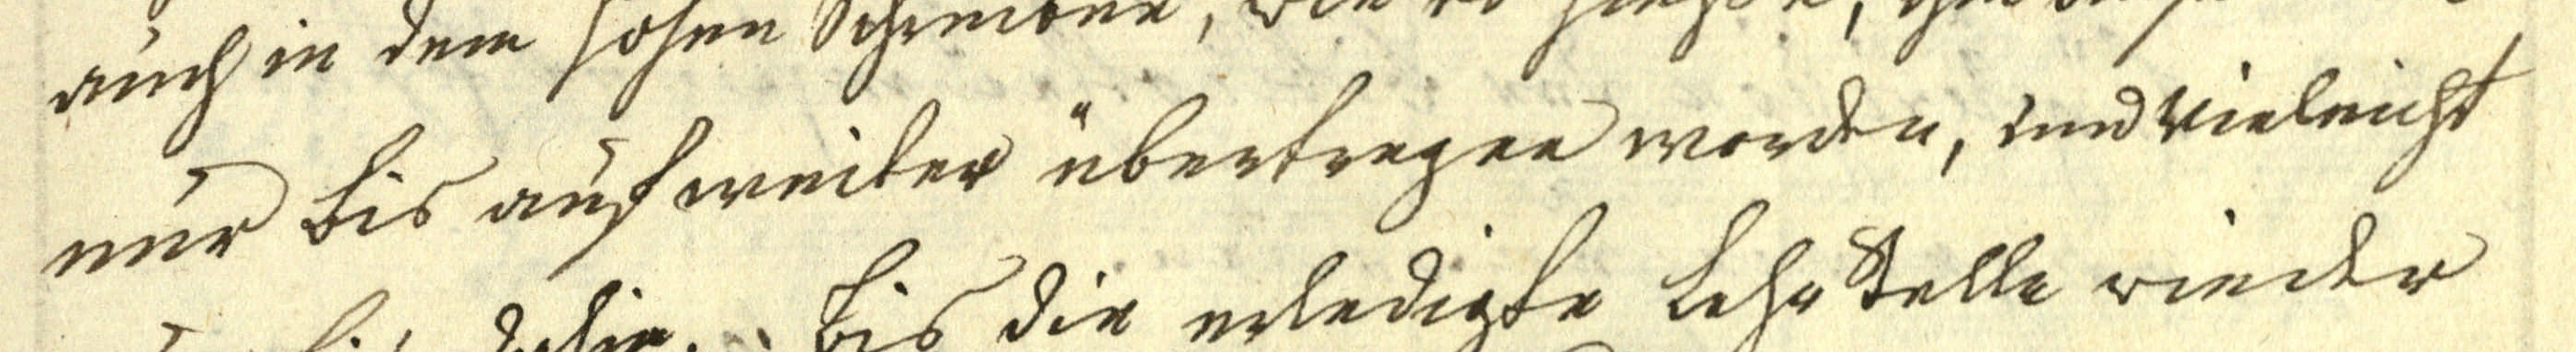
nur bis auf weiter übertragen worden, und vieleicht
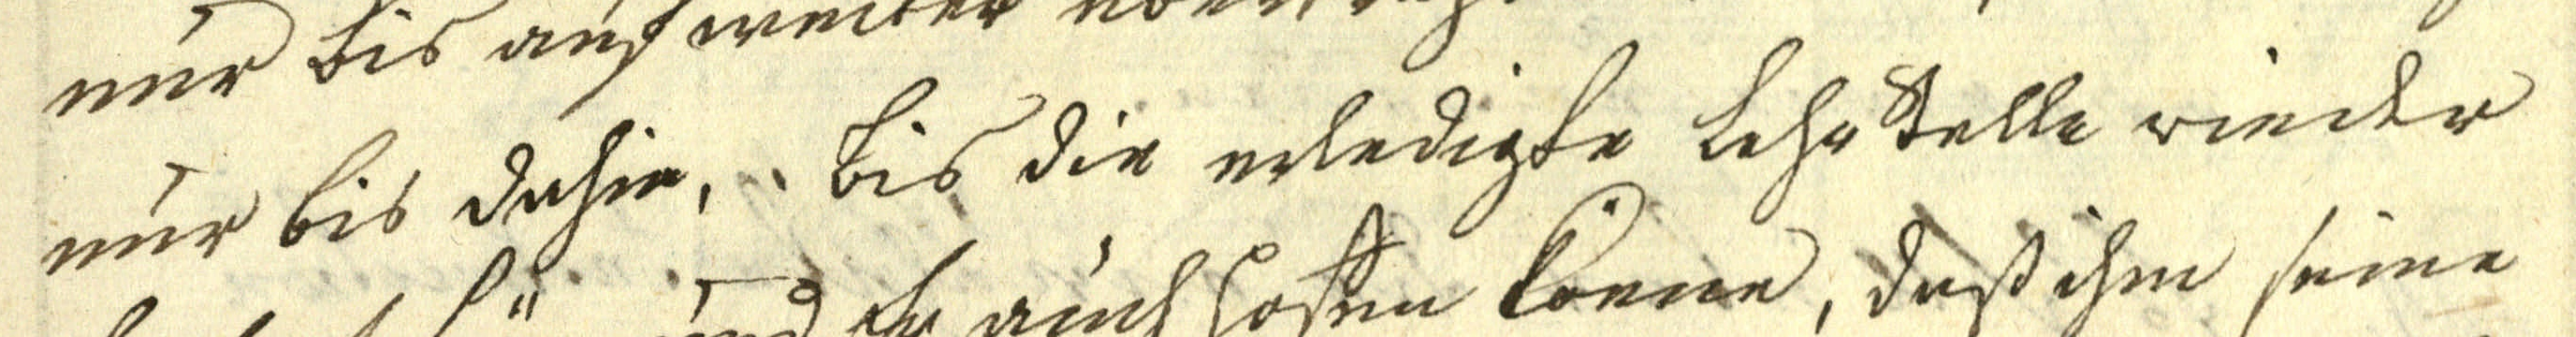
nur bis dahin, bis die erledigte Lehrstelle wieder
